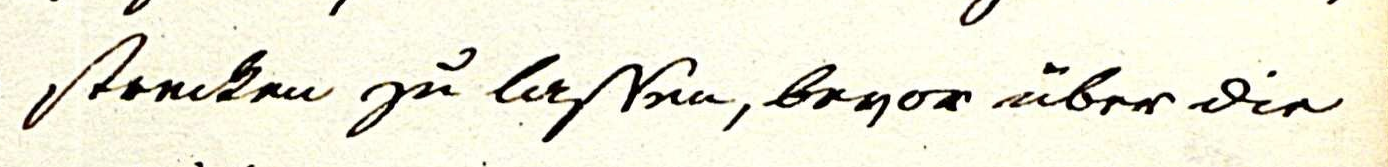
strecken zu laßen, bevor über die
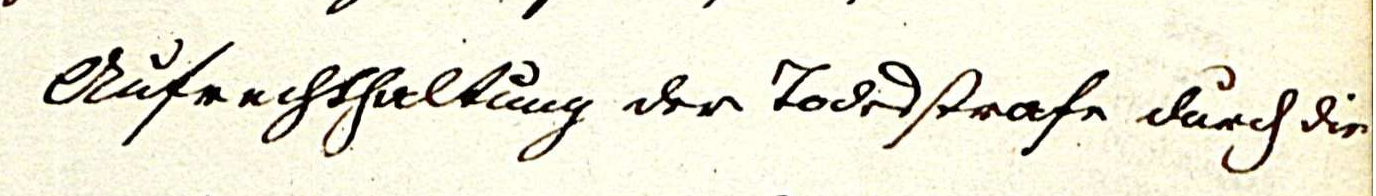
Aufrechthaltung der Todesstrafe durch die
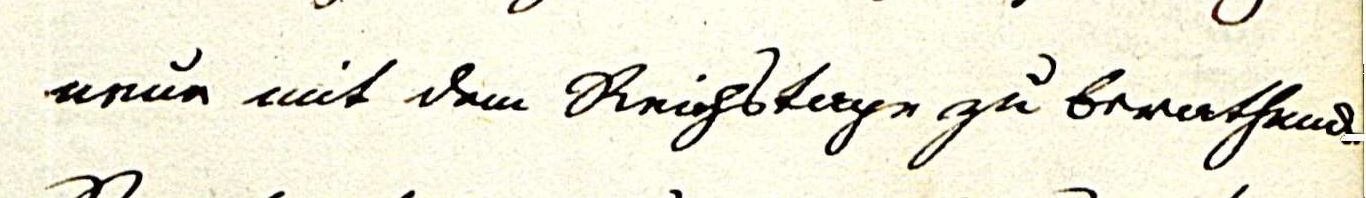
neue mit dem Reichstage zu berathende
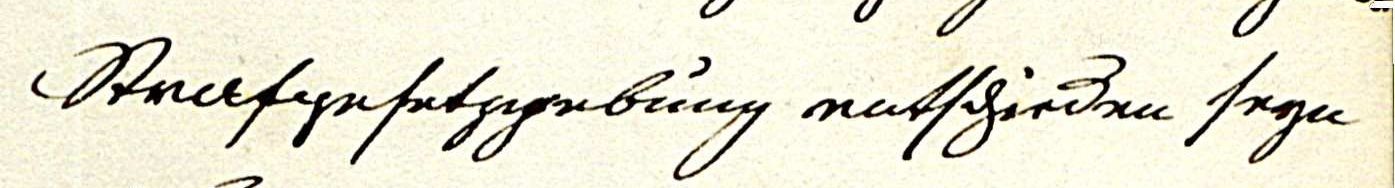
Strafgesetzgebung entschieden seyn
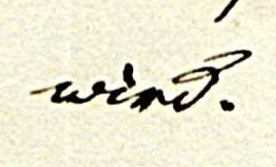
wird.
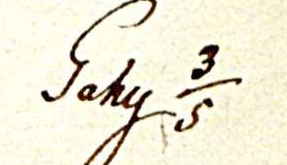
Gáhy 3/5
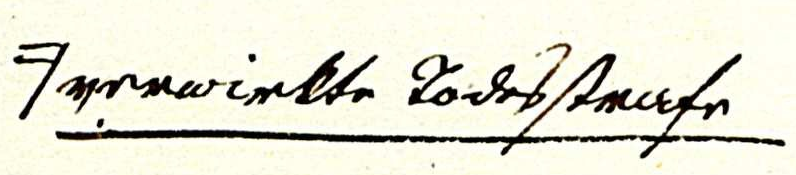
verwirkte Todesstrafe
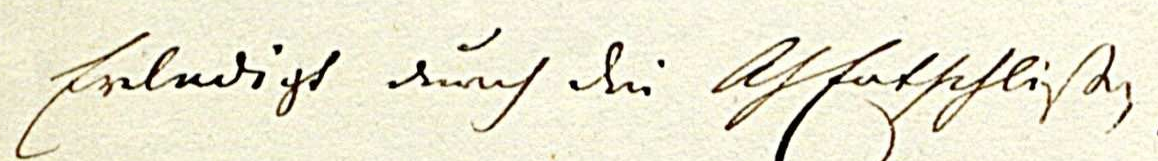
Erledigt durch die Ah Entschließung
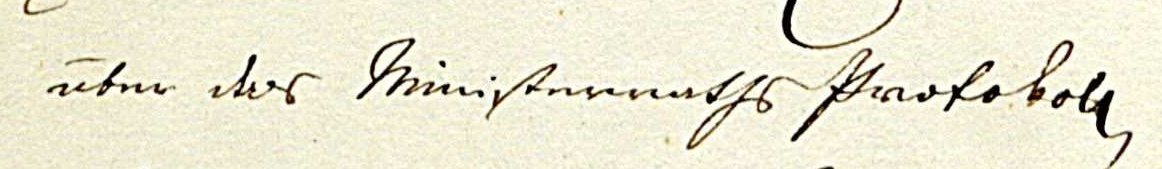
über der Ministerrats-Protokolle
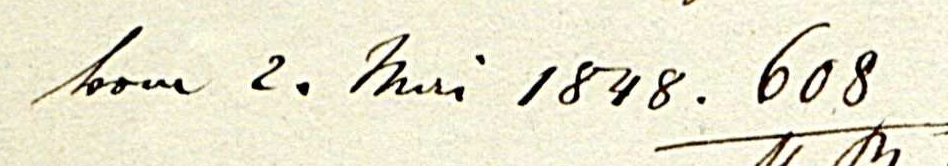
vom 2. Mai 1848 608/
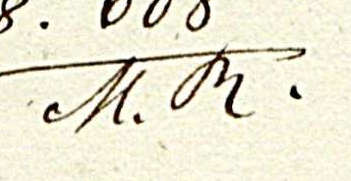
MR
